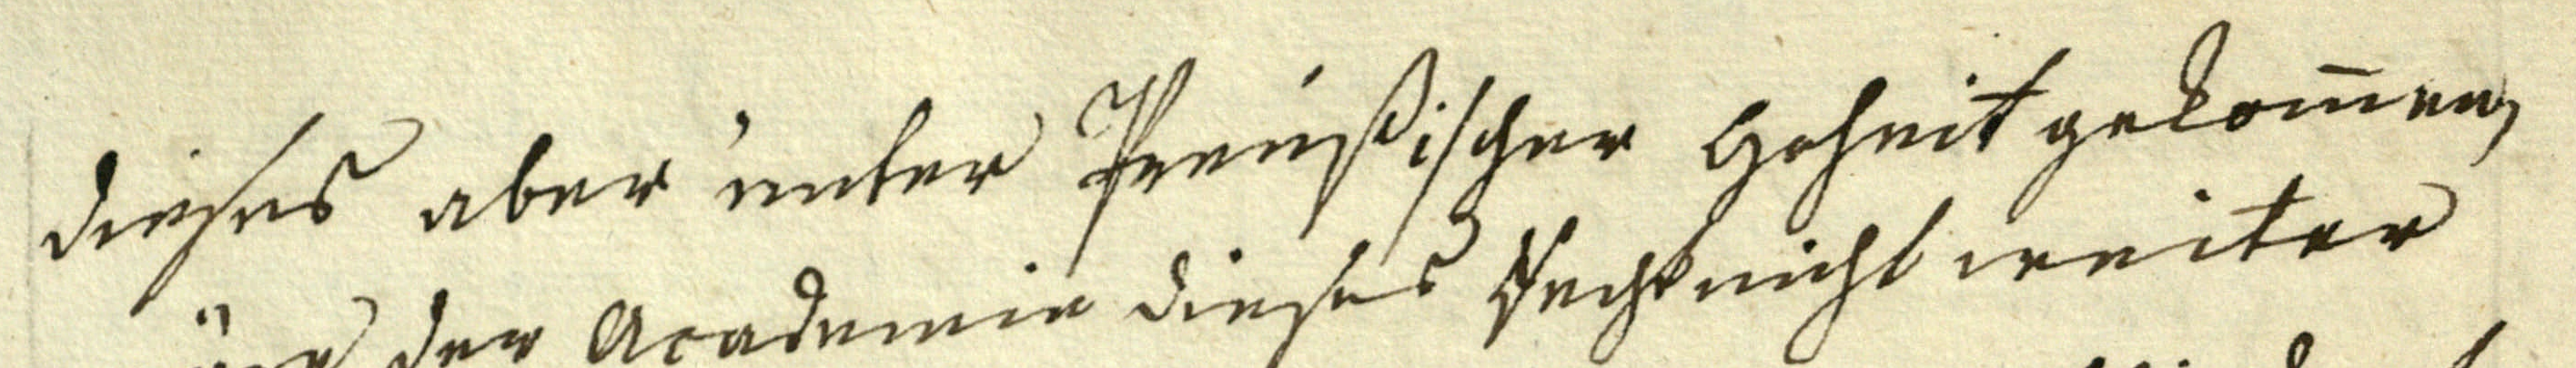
dieses aber unter Preußischer Hoheit gekomen,
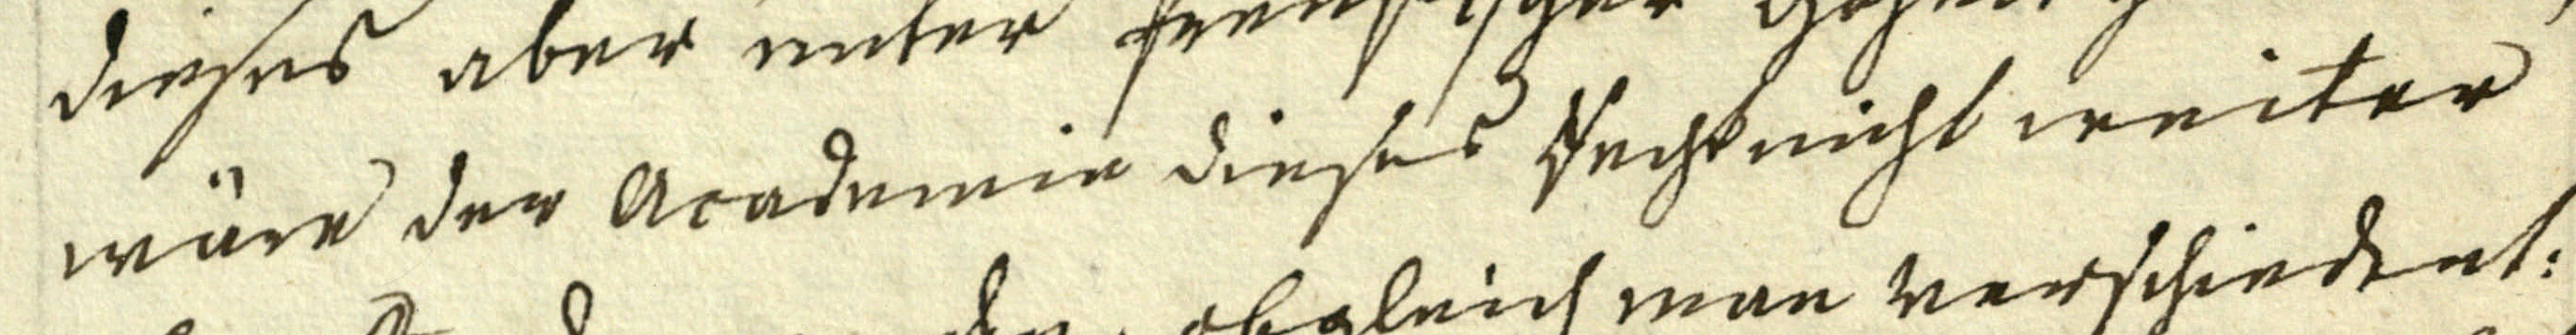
wäre der Academie dieses Recht nicht weiter
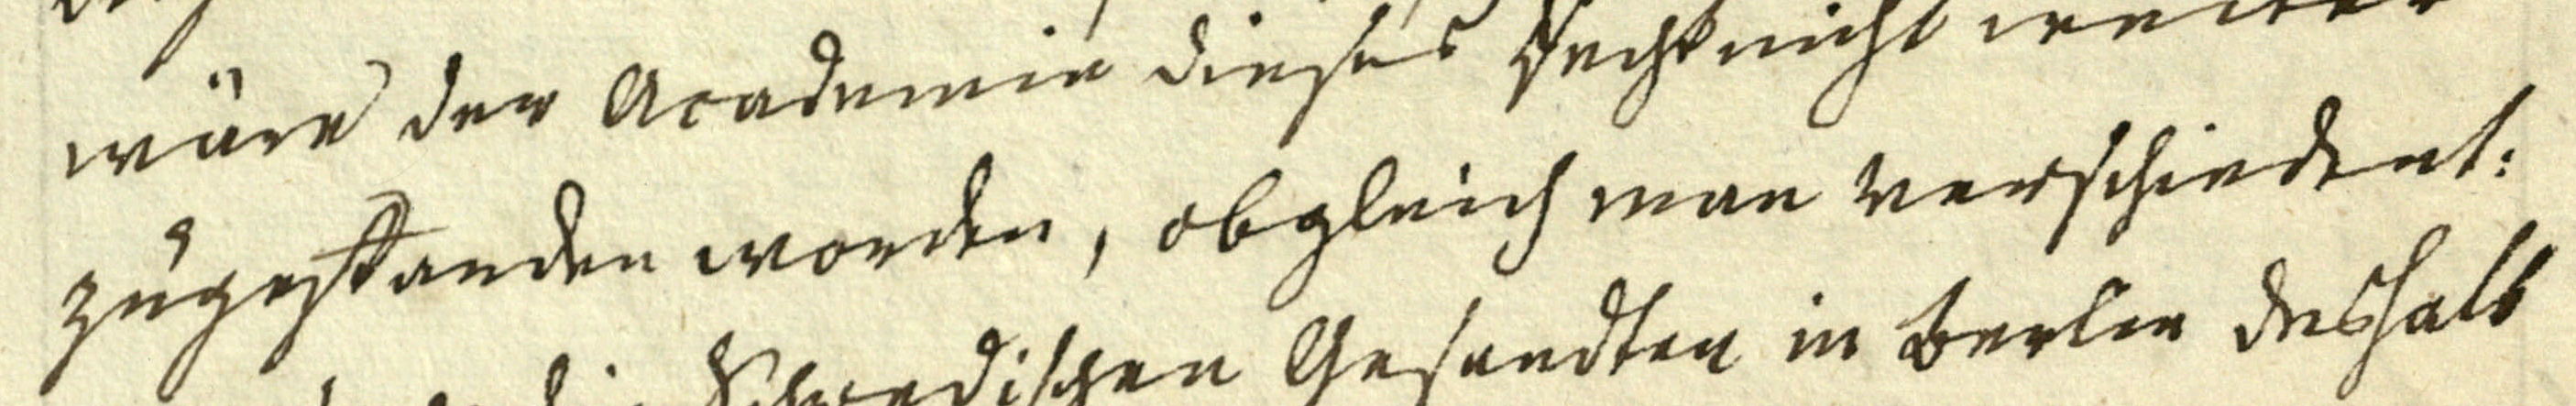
zugestanden worden, obgleich man verschiedent¬
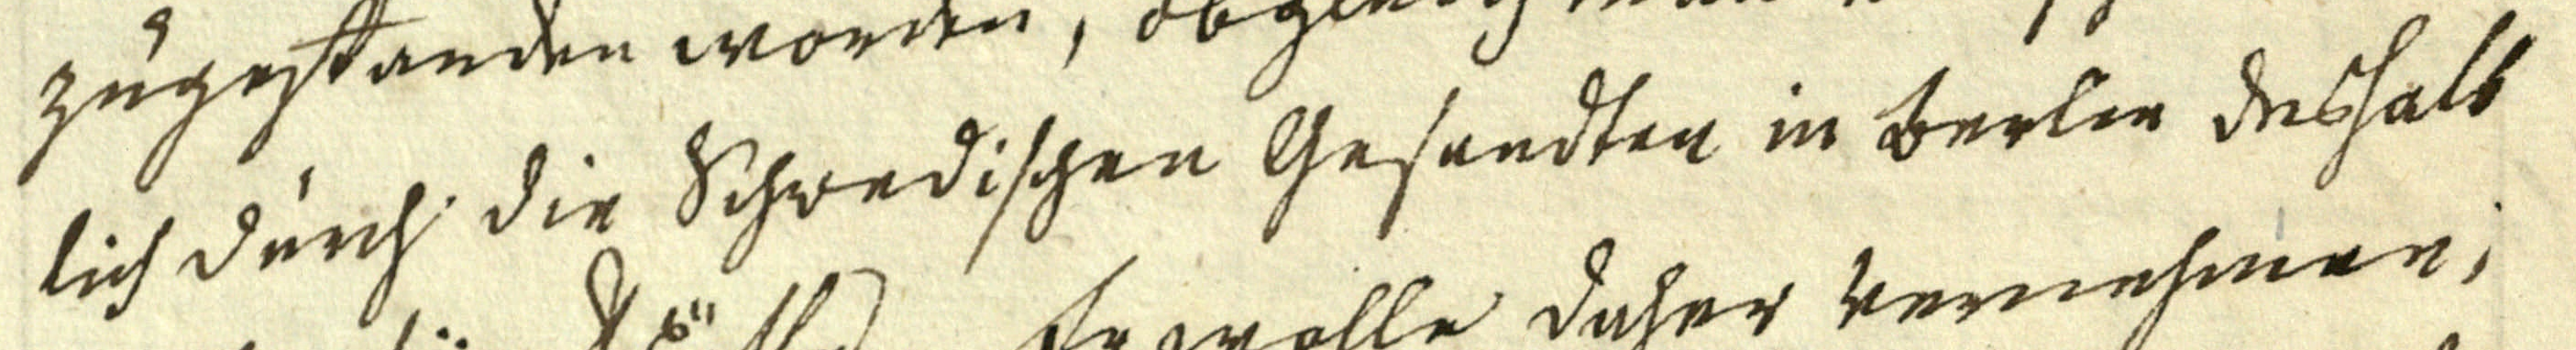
lich durch die Schwedischen Gesandten in Berlin deshalb
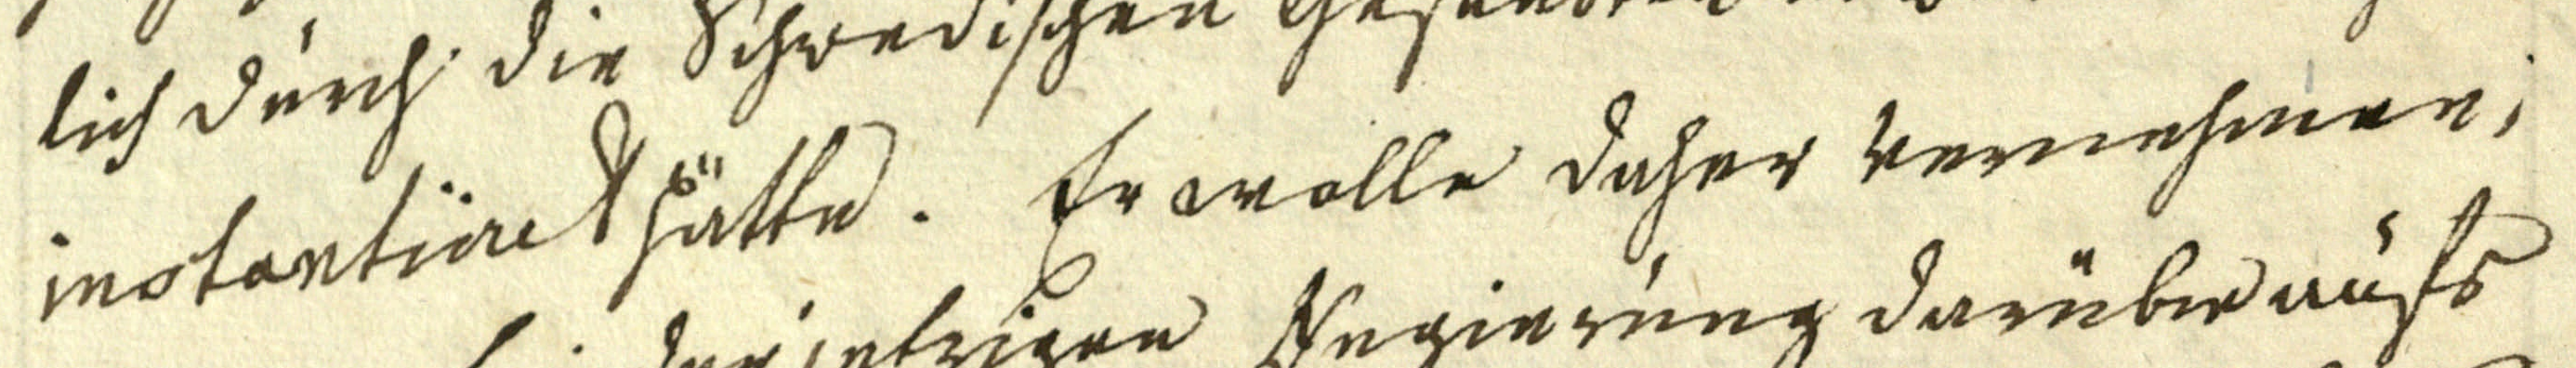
instantiiret hätte. Er wolle daher vernehmen,
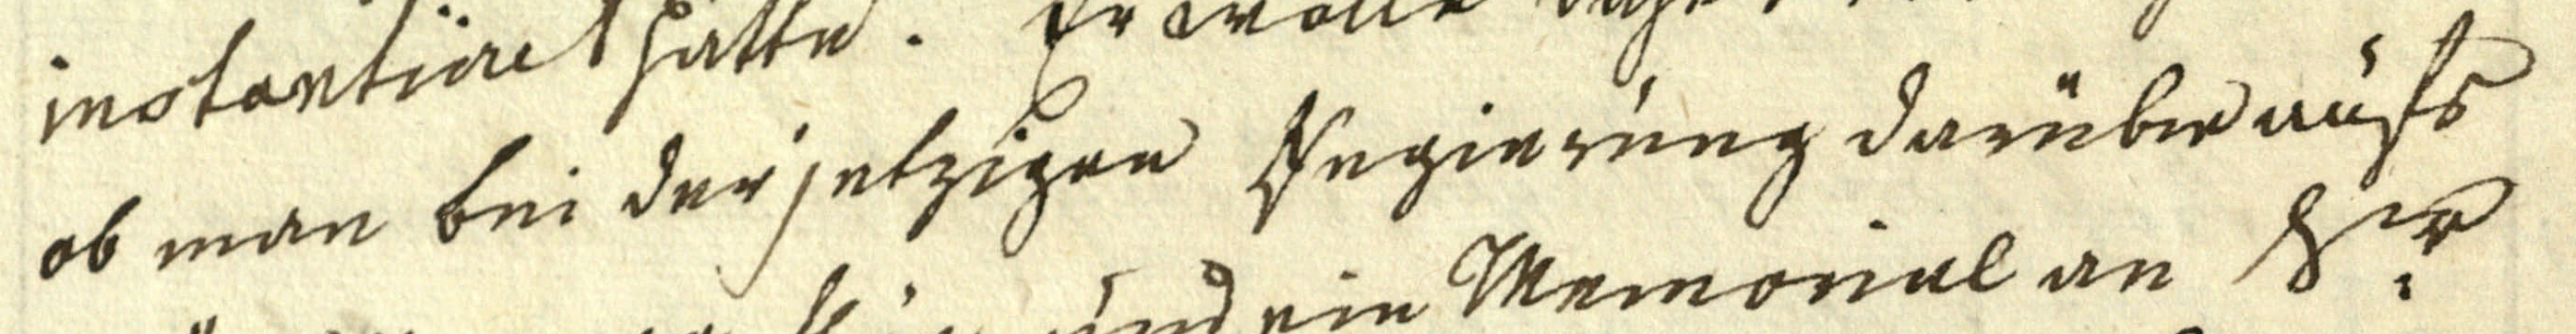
ob man bei der jetzigen Regierung darüber aufs
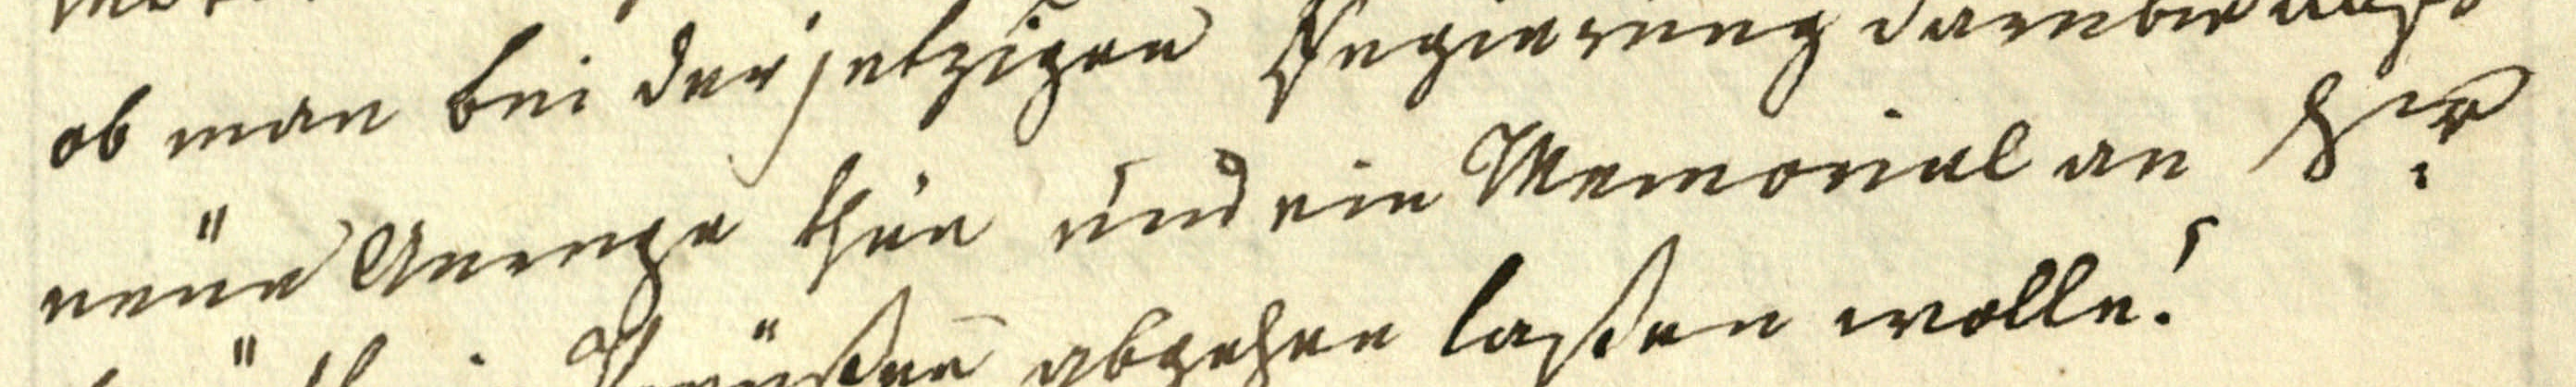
neue Anrege thun und ein Memorial an Sr
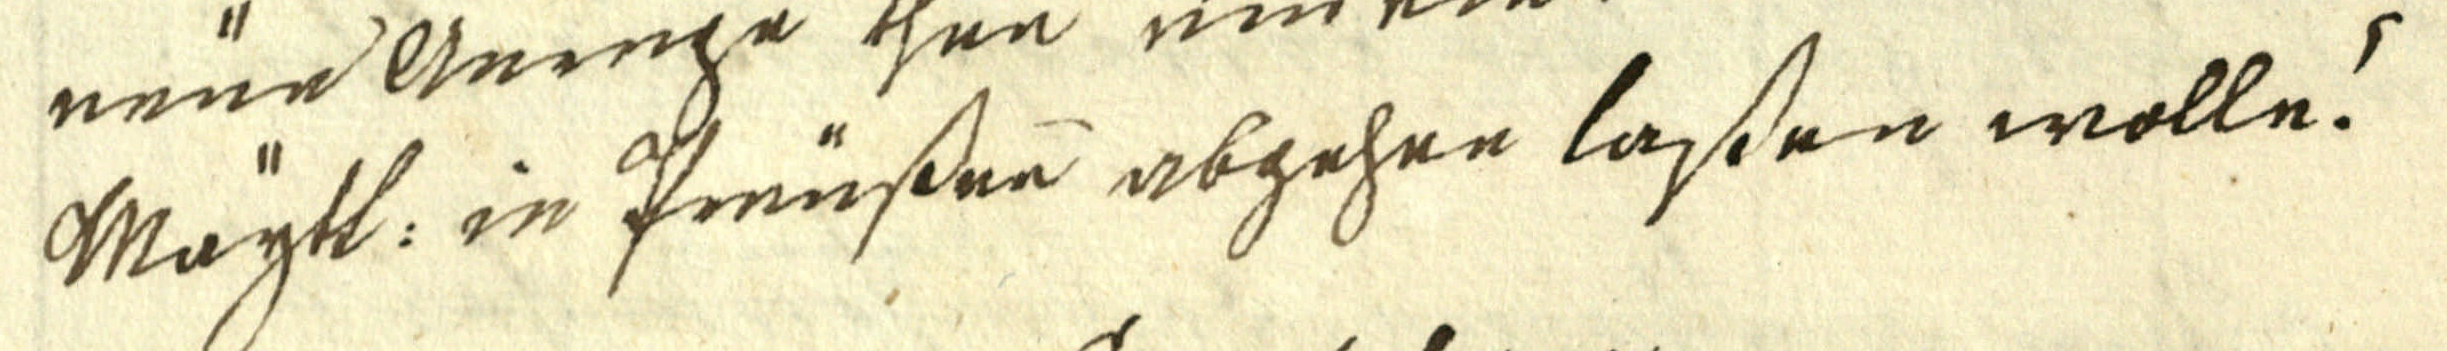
Maÿtt. in Preußen abgehen laßen wolle?
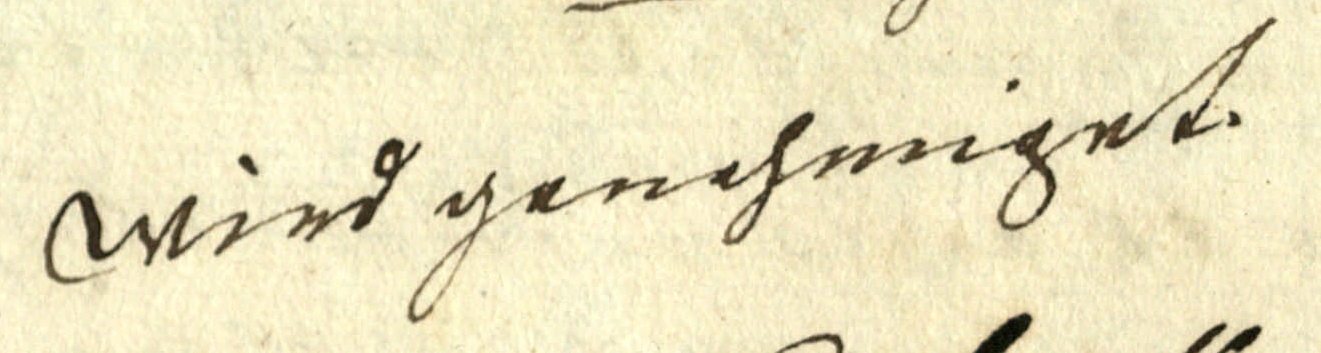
Wird genehmiget.
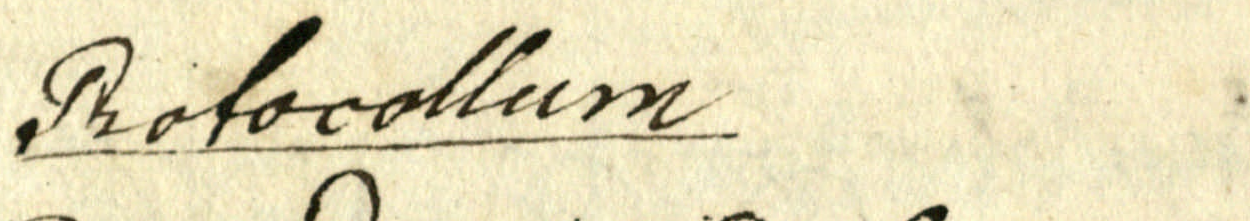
Protocollum
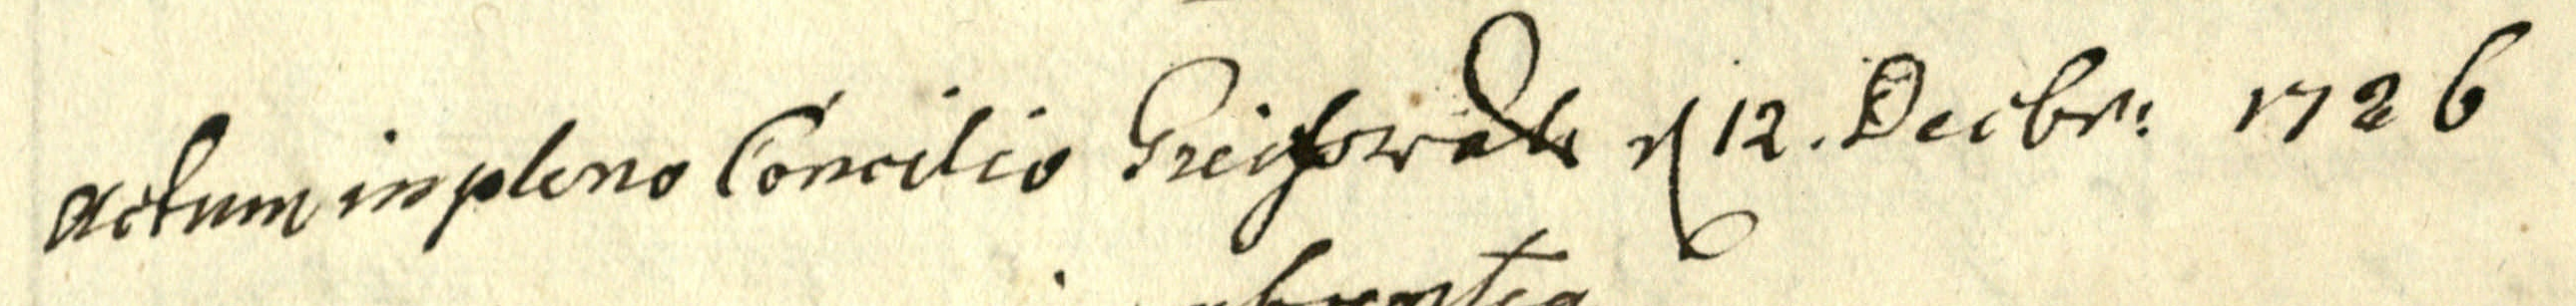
Actum in pleno Concilio Greifswald d 12. Decbr. 1786
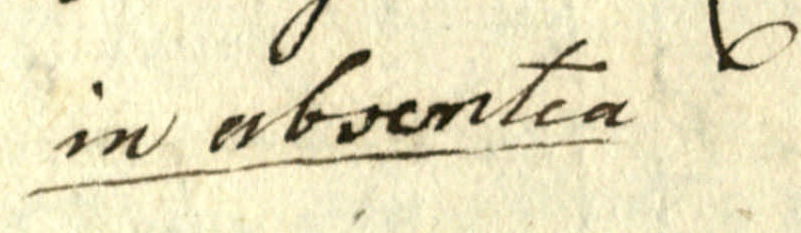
in absentia
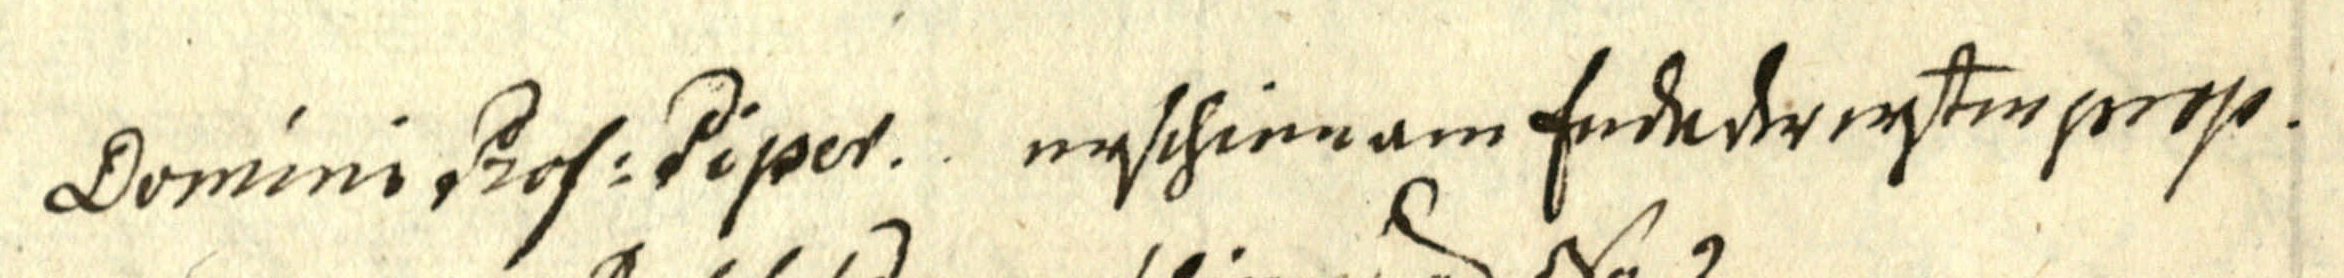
Domini Prof. Piper. erschien am Ende der ersten prop.
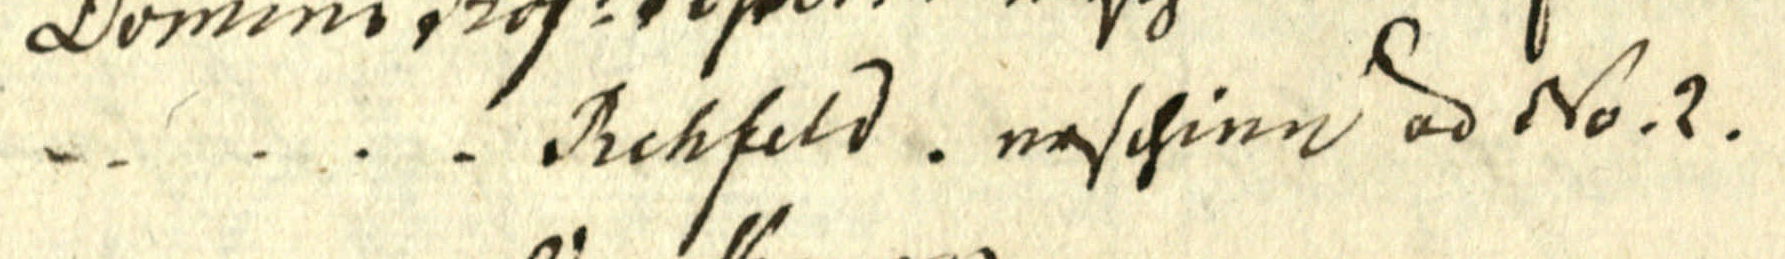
Rehfeld erschien ad No 2.
